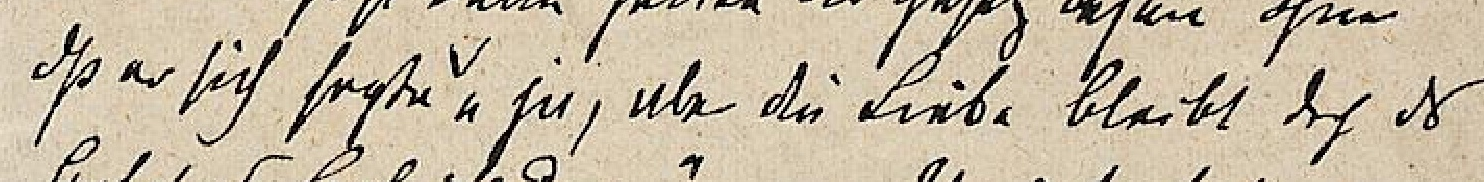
dß er sich fragte "ja, aber die Liebe bleibt doch ds
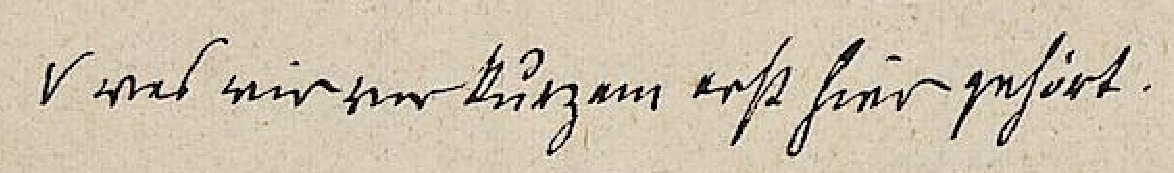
V was wir vor kurzem erst hier gehört.
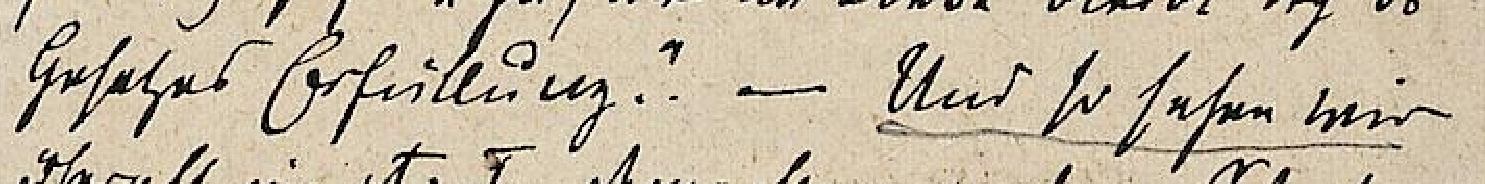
Gesetzes Erfüllung." _ Und so sehen wir
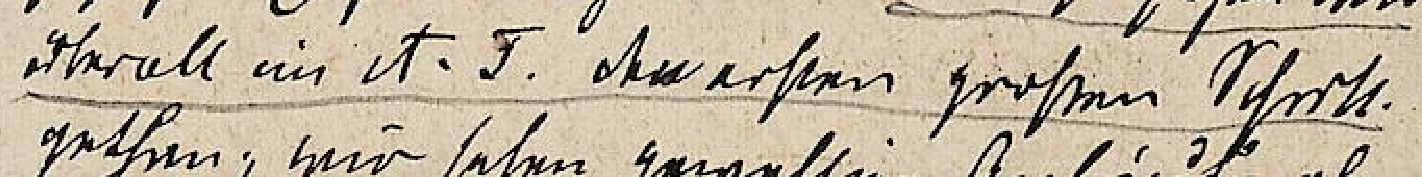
überall im A. T. den ersten großen Schritt
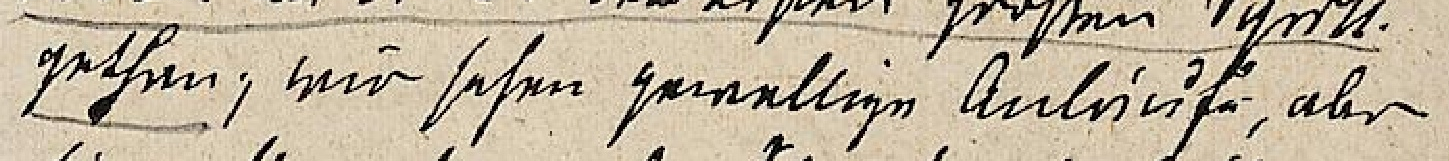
gethan, wir sehen gewaltig Anläufe, aber
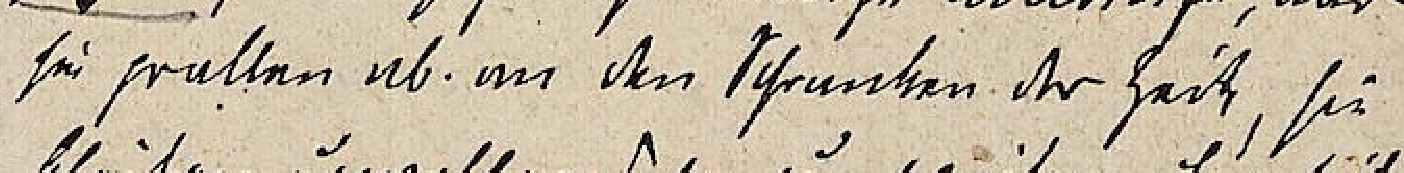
sie prallen ab. an den Schranken der Zeit, sie
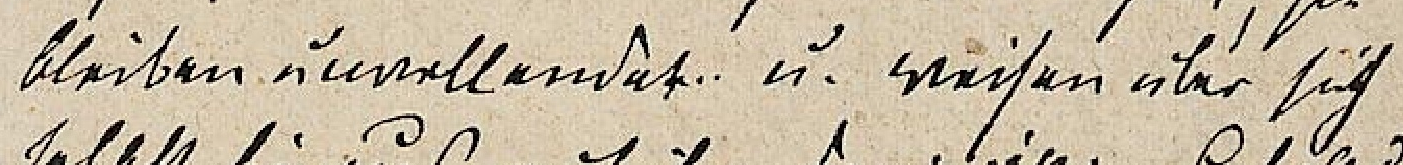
bleiben unvollendet u. weisen über sich
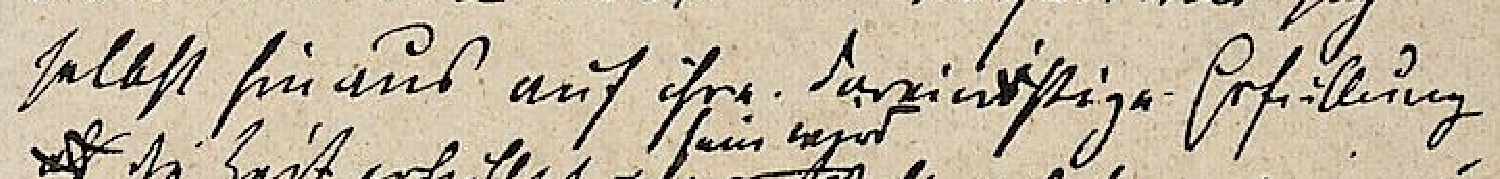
selbst hinaus auf ihre dereinstige Erfüllung
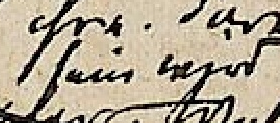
sein wird
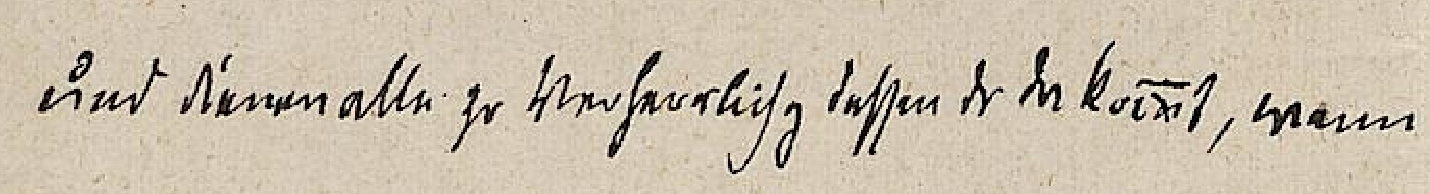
und dienen alle zr. Verherrlichg. dessen dr da komt, wenn
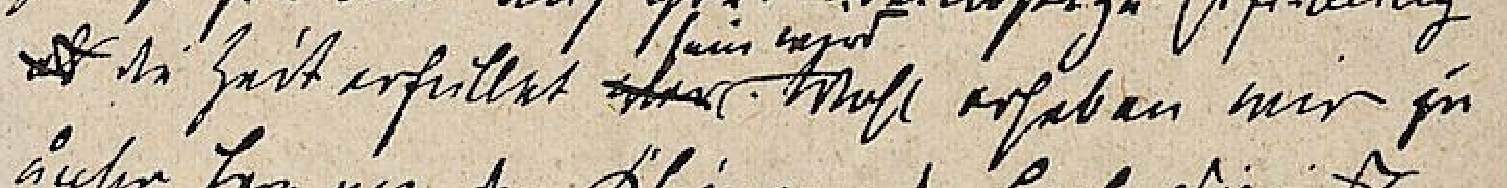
als die Zeit erfüllet war. Wohl erheben wir ja
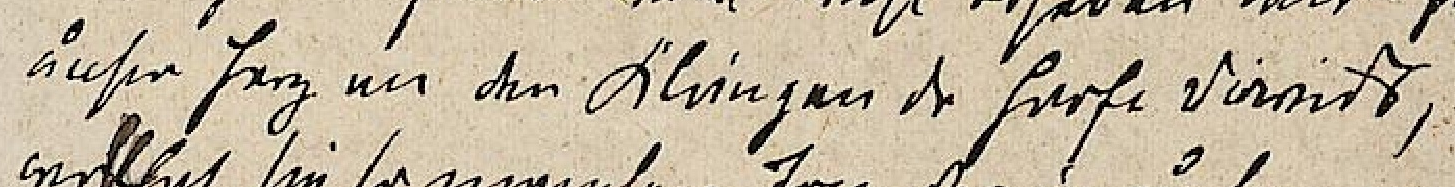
unsr Herz den Klängen dr Harfe Davids,
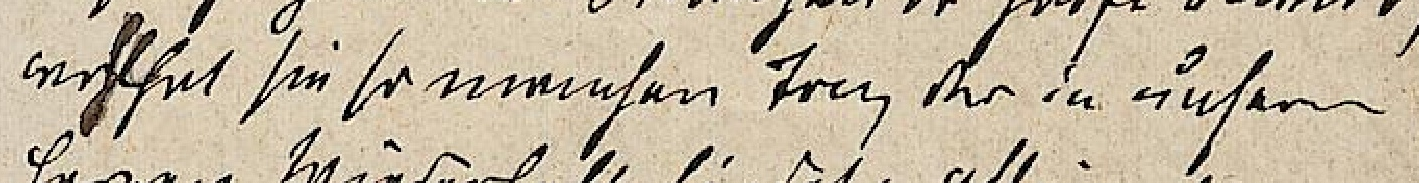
wohl hat sie so manchen Ton, dr in unsern
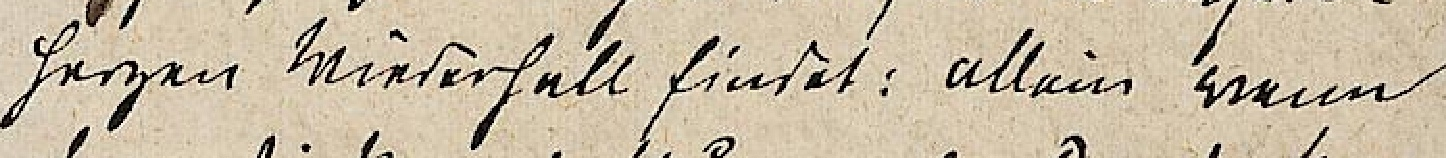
Herzen Wiederhall findet: allein wenn
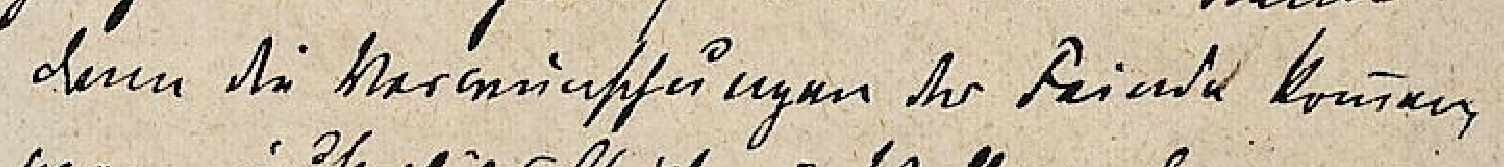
denn die Verwünschungen dr Feinde komen,
